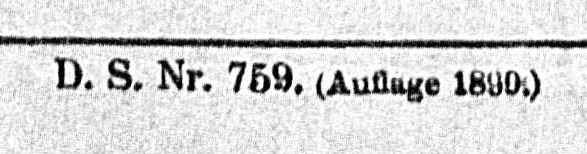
D. S. Nr. 759. (Auflage 1890.)
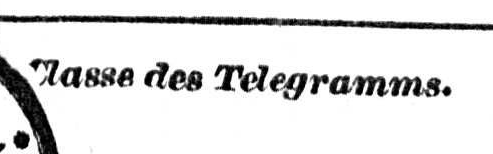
Classe des Telegramms.
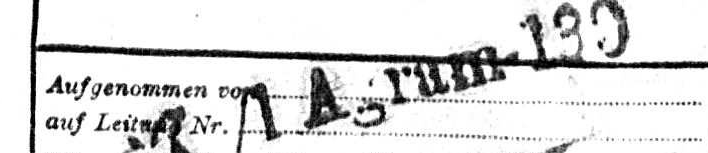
Aufgenommen von......................xx....................................................
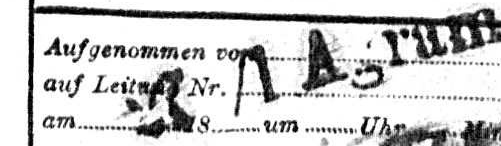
auf Leitung Nr..................................................................................
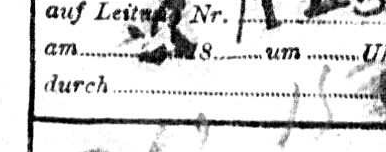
am...........18......um............Uhr..............Min........................ Mittag
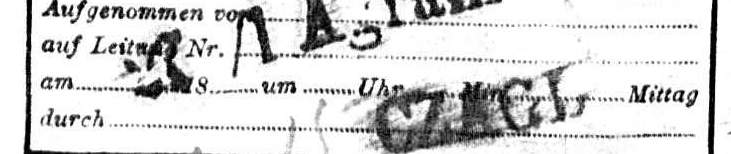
durch......................Czagl.............................................................................
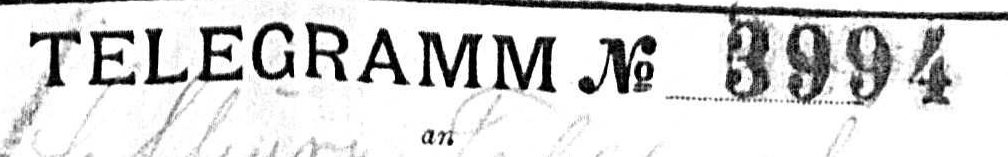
Telegramm No 3994
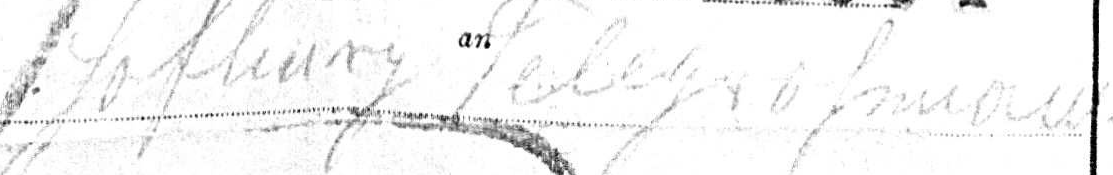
xx an Telegrafenamt
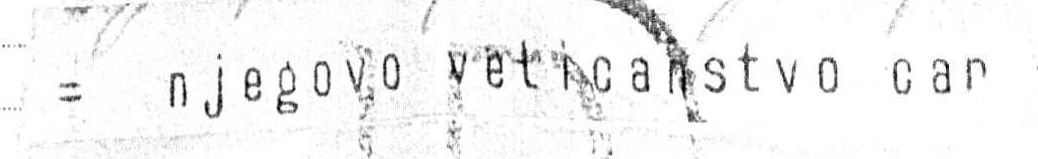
= njegovo velicanstvo car
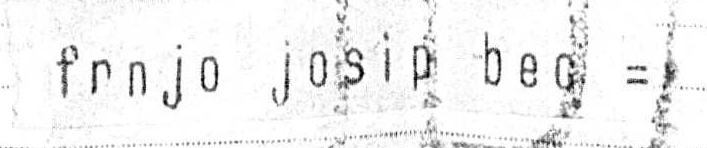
frnjo josip bec =
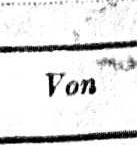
Von
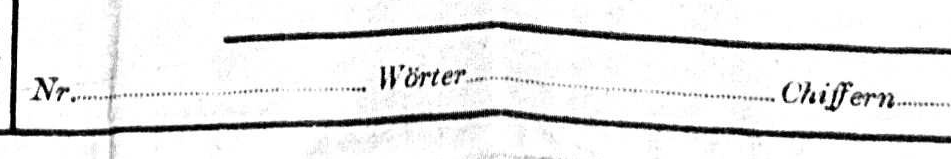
Nr.................................Wörter...............................Chiffern.................
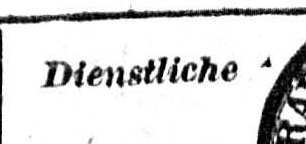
Dienstliche xx
